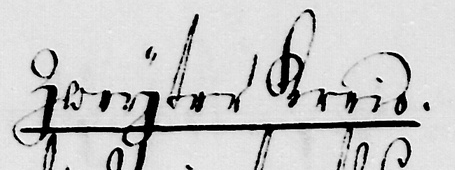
Zweyter Kreis.
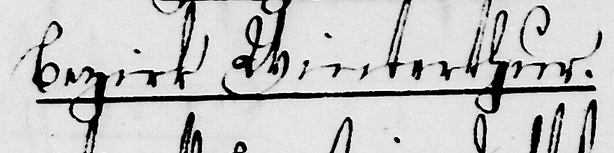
Bezirk Winterthur.
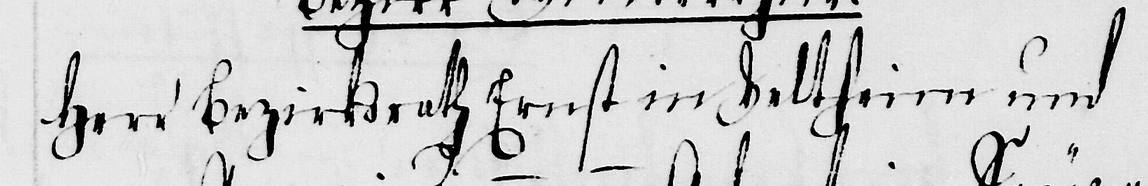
Herr Bezirksrath Ernst in Veltheim und
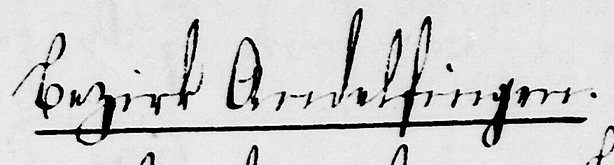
Bezirk Andelfingen.
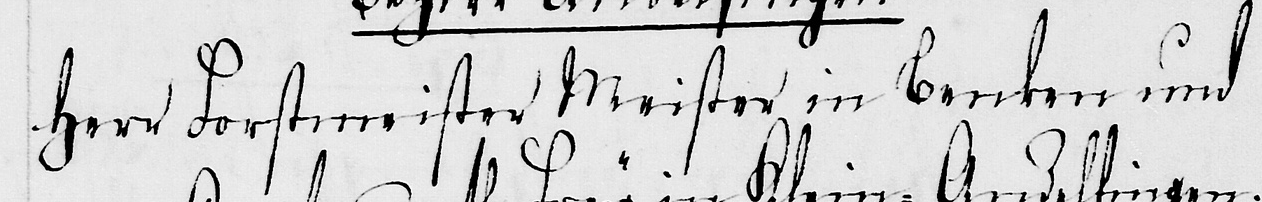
Herr Forstmeister Meister in Benken und
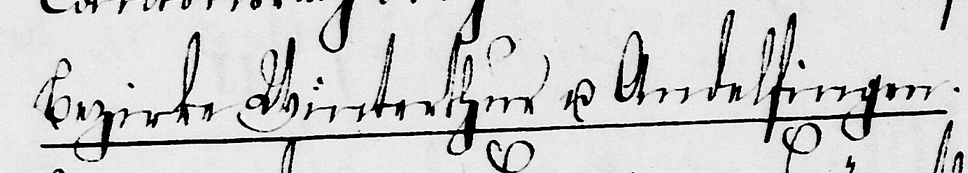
Bezirke Winterthur u. Andelfingen.
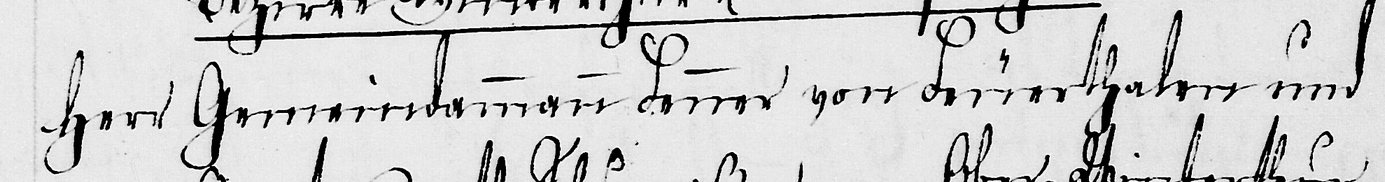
Herr Gemeindammann Fenner von Feuerthalen und
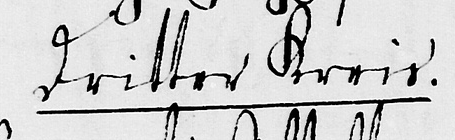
Dritter Kreis.
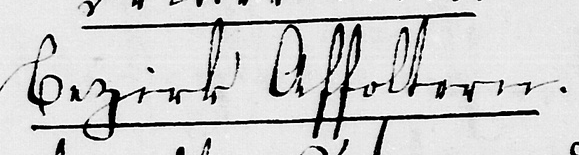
Bezirk Affoltern.
